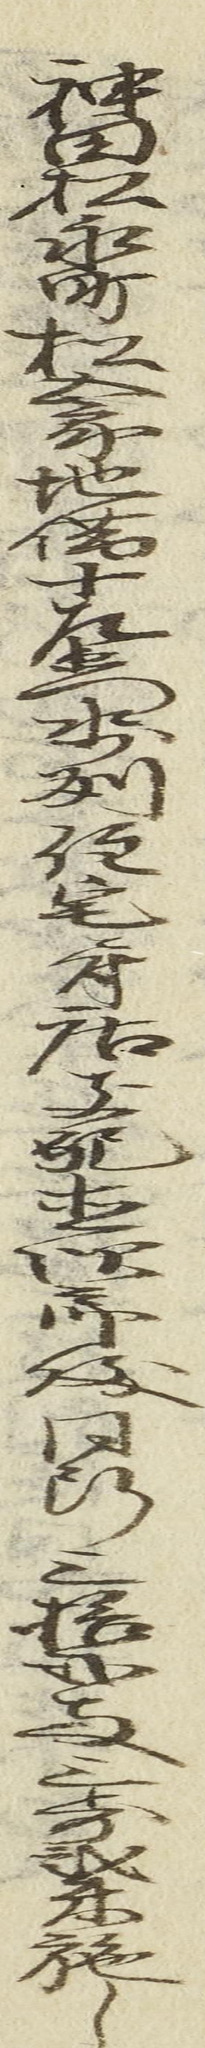一神田松永町松五郎地借十左衛門勢州住宅ニ付店支配人直次郎儀同断三拾弐両三歩弐朱施し
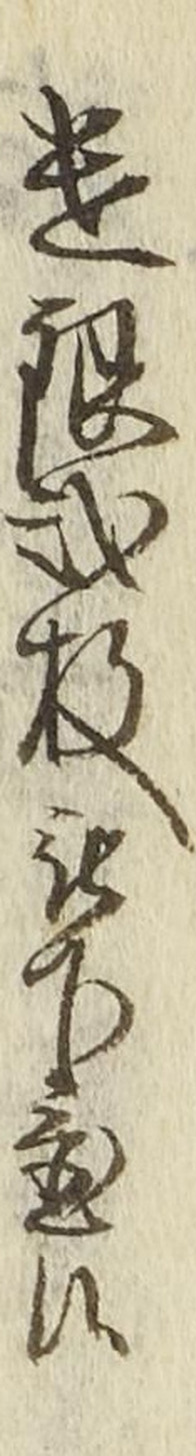遣銀弐枚被下置候
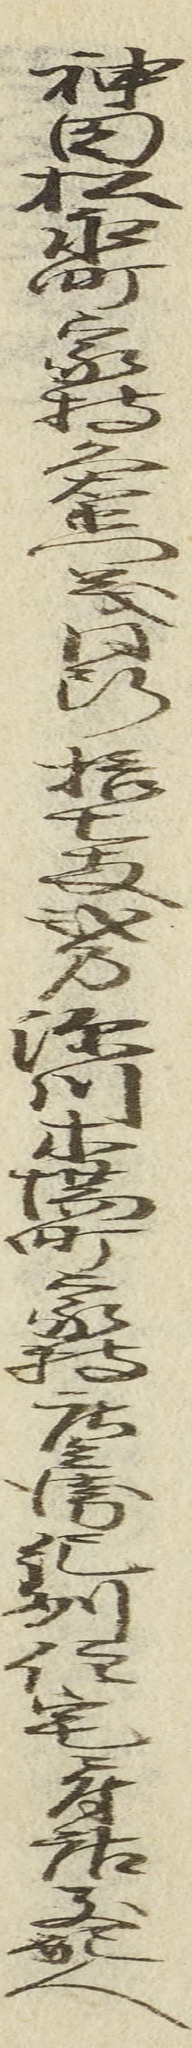一神田松永町家持久右衛門義同断拾七両弐分深川木場町家持庄兵衛紀州住宅ニ付店支配人
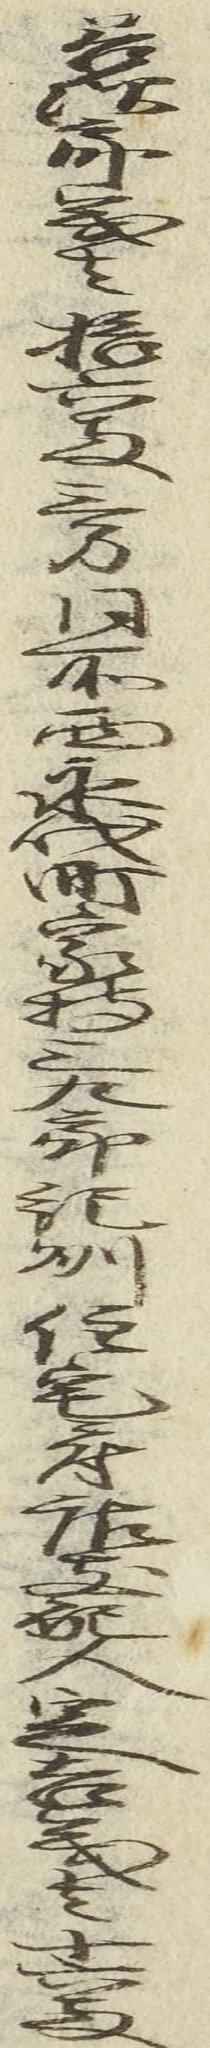善次郎義者拾六両三分同所西永代町家持三九郎紀州住宅ニ付店支配人定吉義者十六両
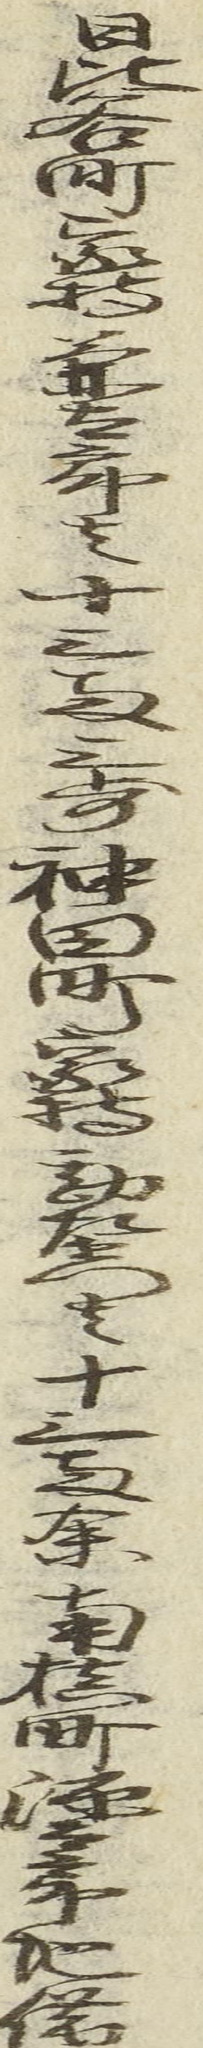日比谷町家持兼太郎者十三両三歩神田町家持勘左衛門者十三両余南槙町源太郎地借
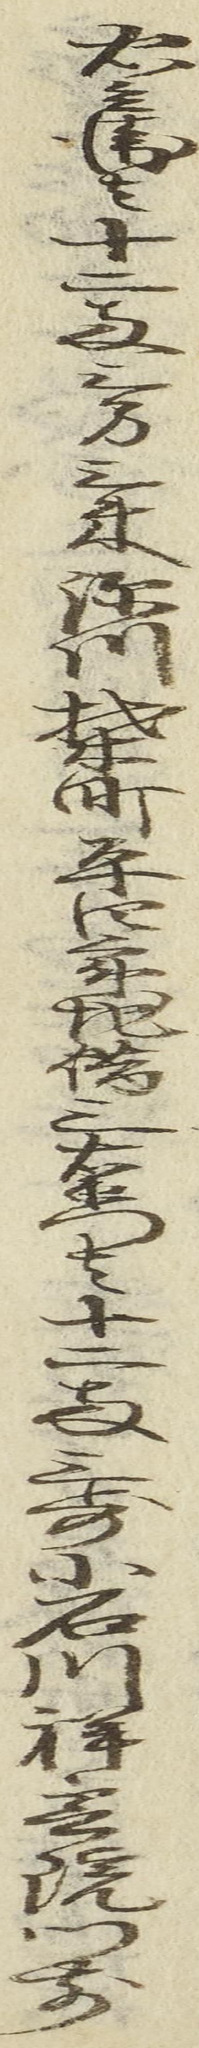忠兵衛者十二両三分三朱深川材木町平四郎地借三右衛門者十二両三歩小石川祥雲院門前

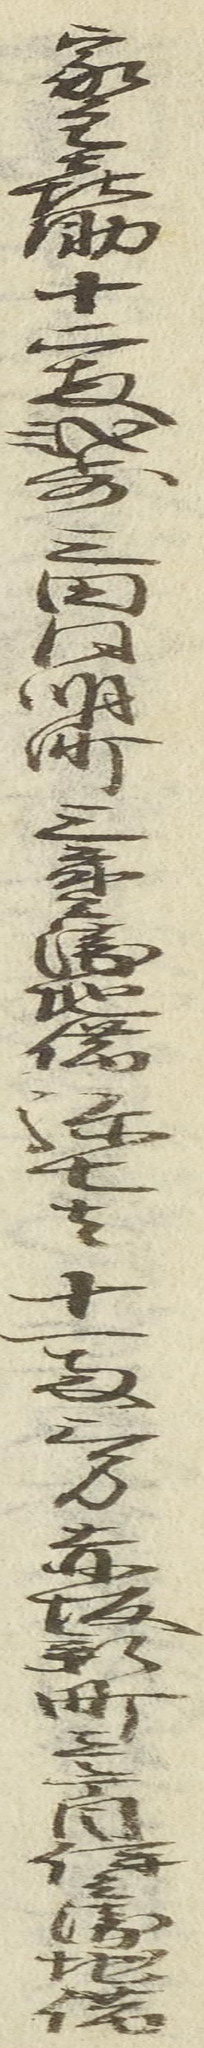家主喜助十二両弐歩三田同朋町三郎兵衛地借弥七者十一両三分赤坂新町壱丁目伊兵衛地借
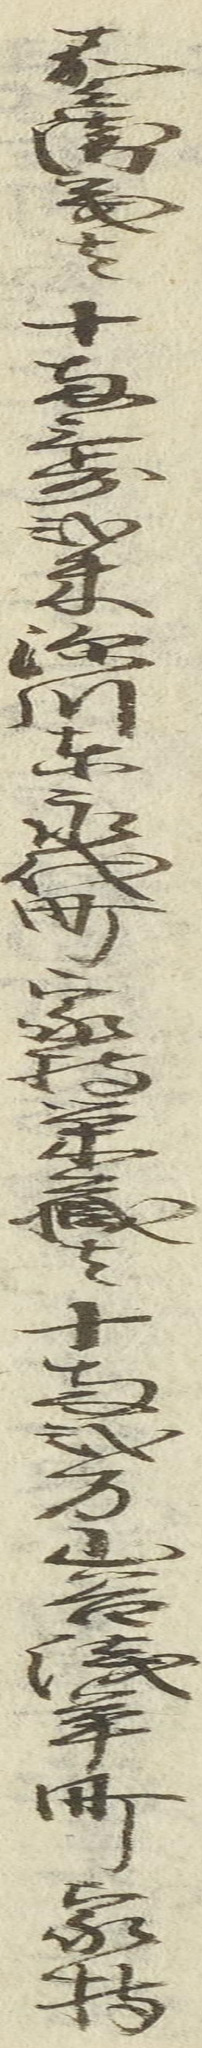嘉兵衛義者十両三歩弐朱深川東永代町家持栄蔵者十両弐分山谷浅草町家持
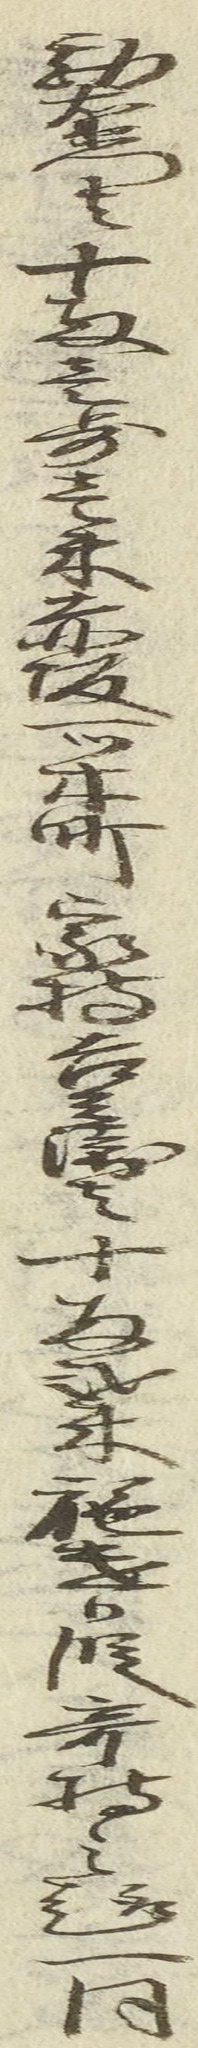勘右衛門者十両壱歩壱朱赤坂一ツ木町家持吉兵衛者十両弐朱施遣候段奇特之趣一同
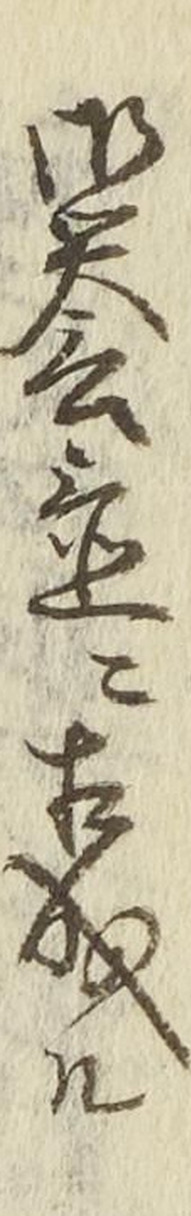御誉置ニ相成ル
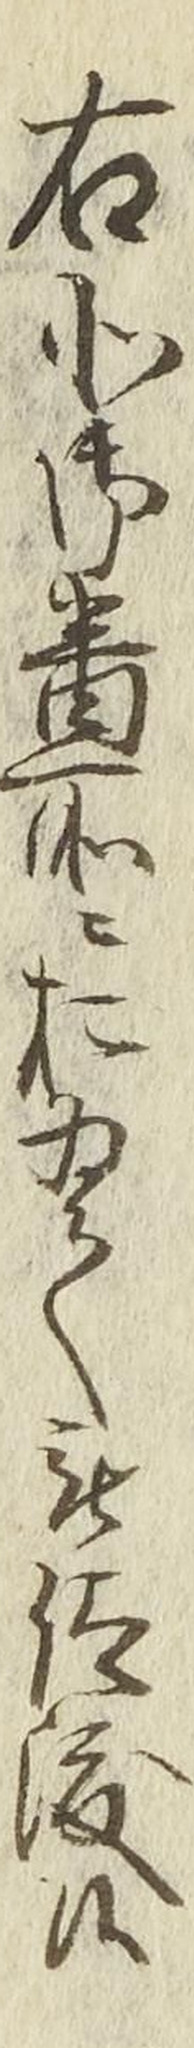右北御番所ニ於ゐて被仰渡候
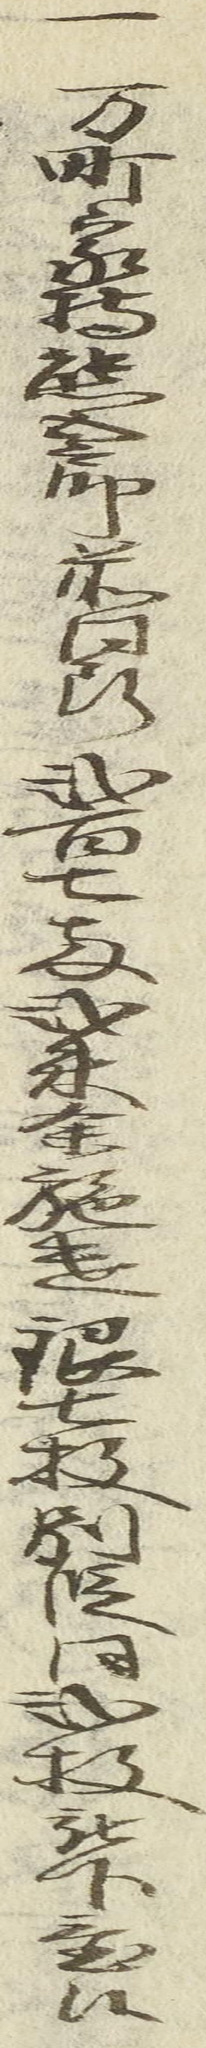一万町家持熊五郎前同断弐百七両弐朱余施遣銀七枚別段同弐枚被下置候
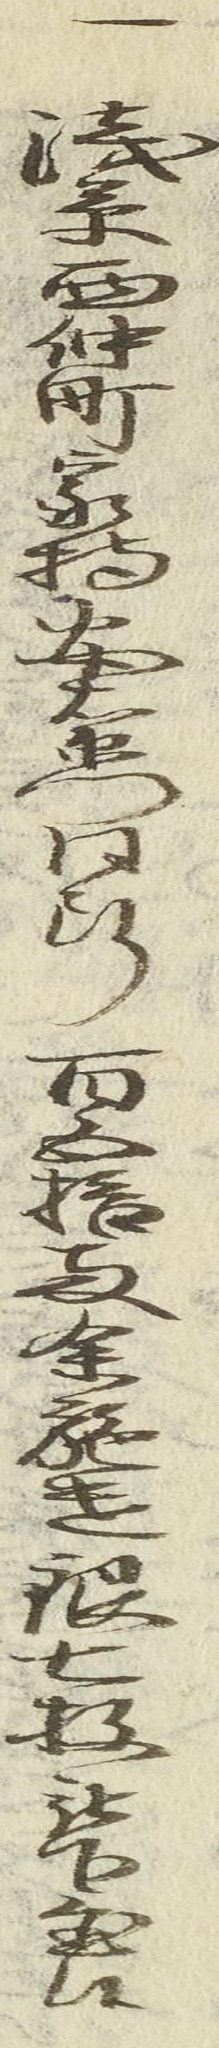一浅草西仲町家持安右衛門同断百五拾両余施遣銀七枚被下置候
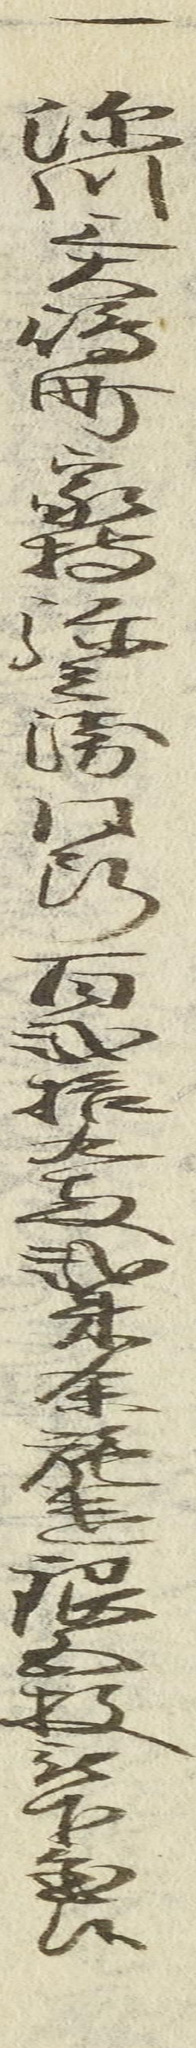一深川上大嶋町家持弥兵衛同断百弐拾九両弐朱施遣銀五枚被下置候
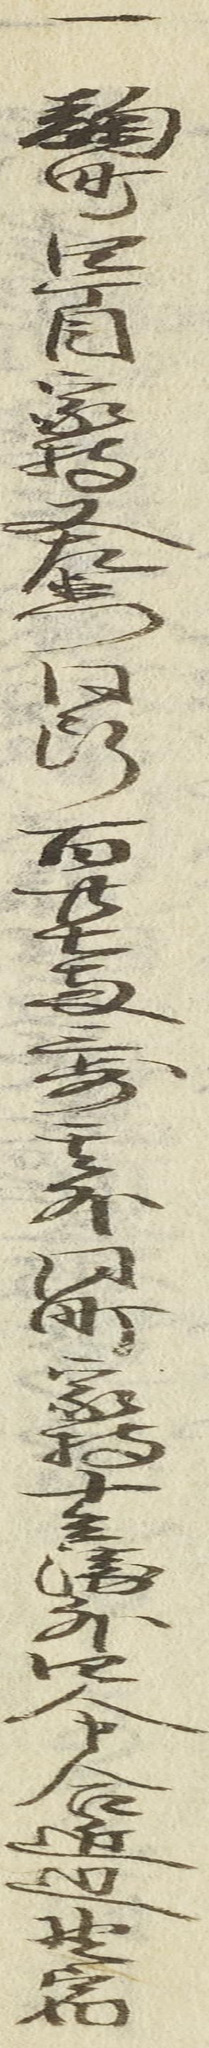一麹町四丁目家持又左衛門同断百廿七両三歩其外同町家持十兵衛外四人申合近辺野宿
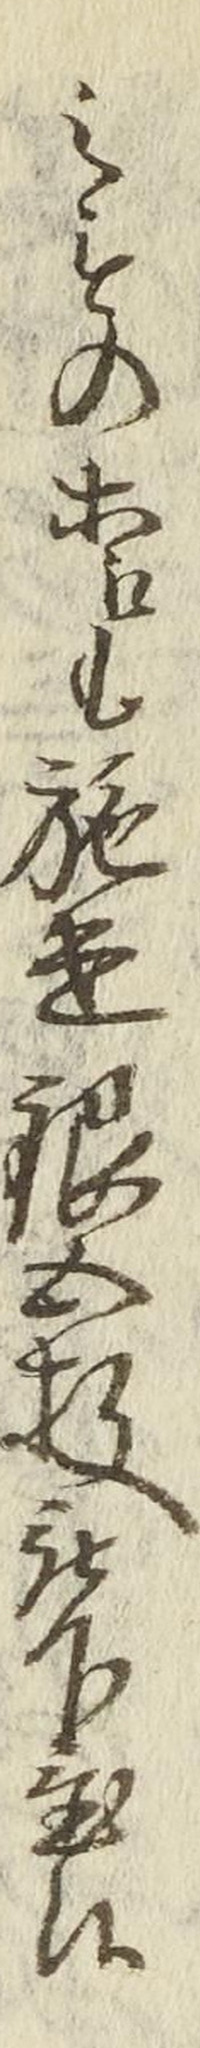之もの等江も施遣銀五枚被下置候
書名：安政二年震災記事　完
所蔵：東京大学地震研究所図書室 Earthquake Research Institute Library, The University of Tokyo, JAPAN
